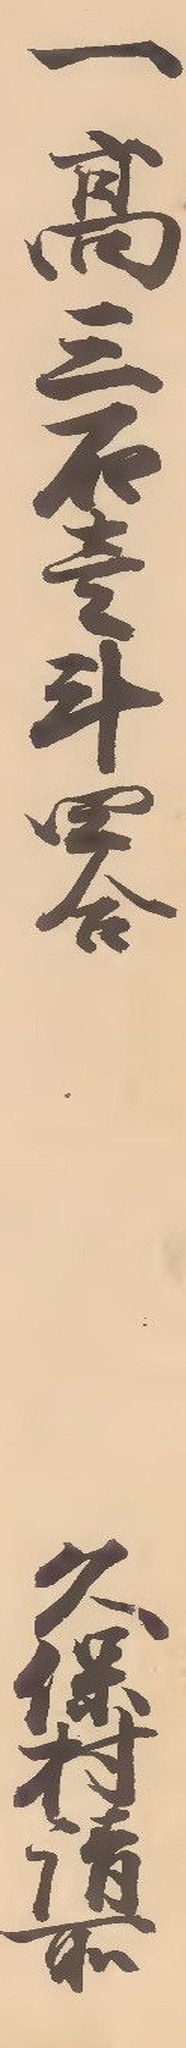一高三石壱斗四合久保村請所
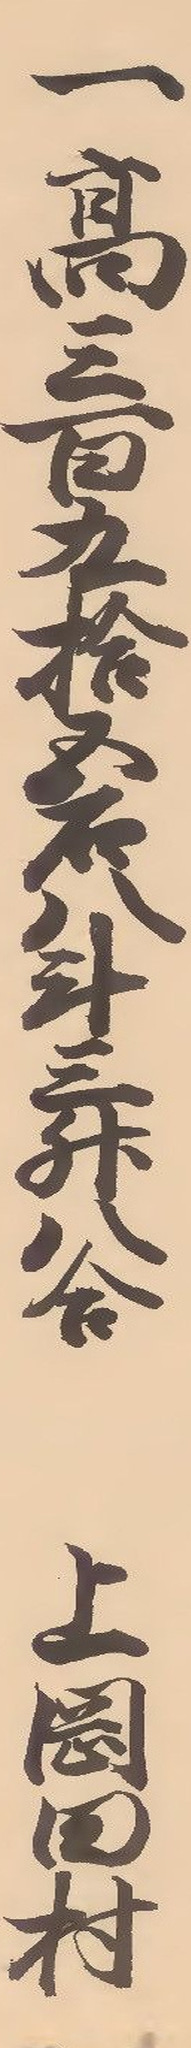一高三百九拾五石八斗三升八合上岡田村
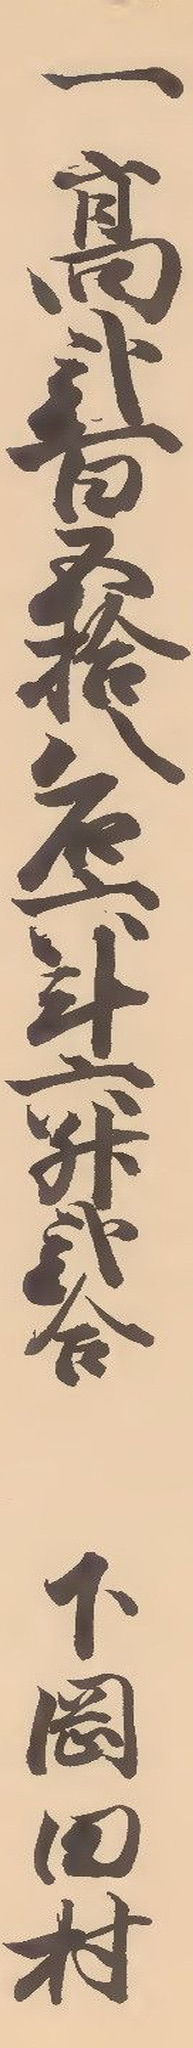一高弐百五拾八石六斗六升弐合下岡田村
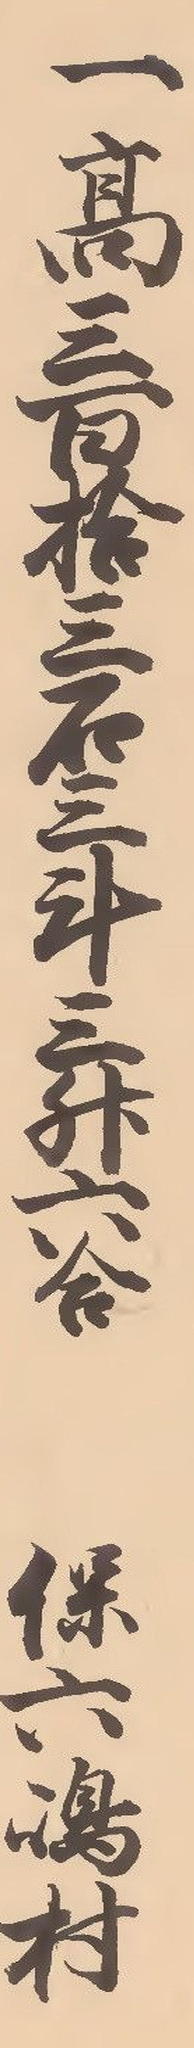一高三百拾三石三斗三升六合保六島村
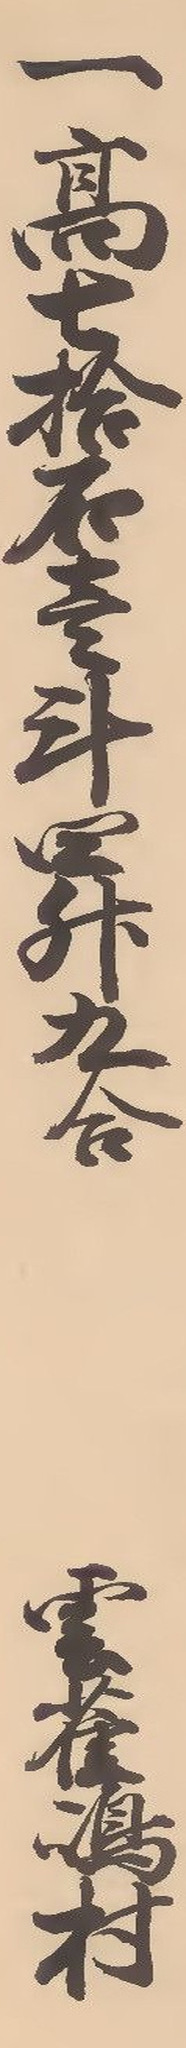一高七拾石壱斗四升九合雲雀島村
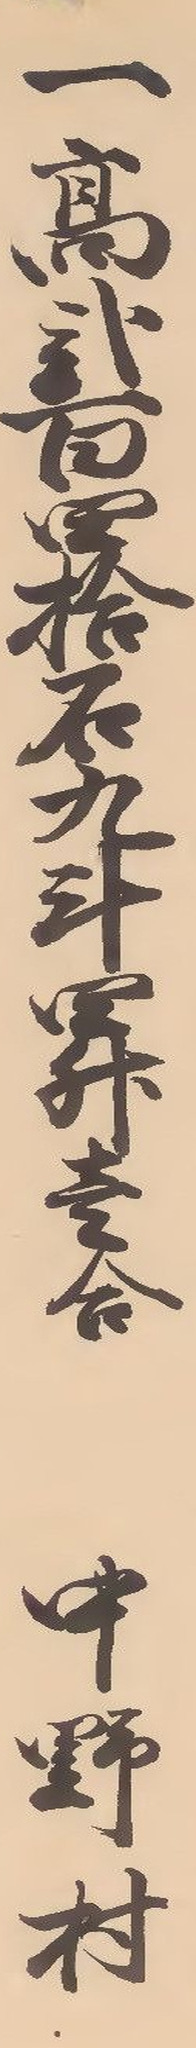一高弐百四拾石九斗四升壱合中野村
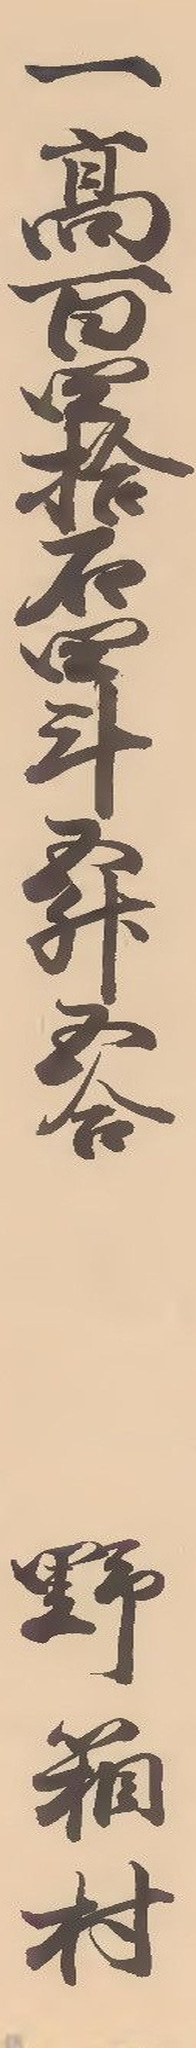一高百四拾石四斗五升五合野箱村
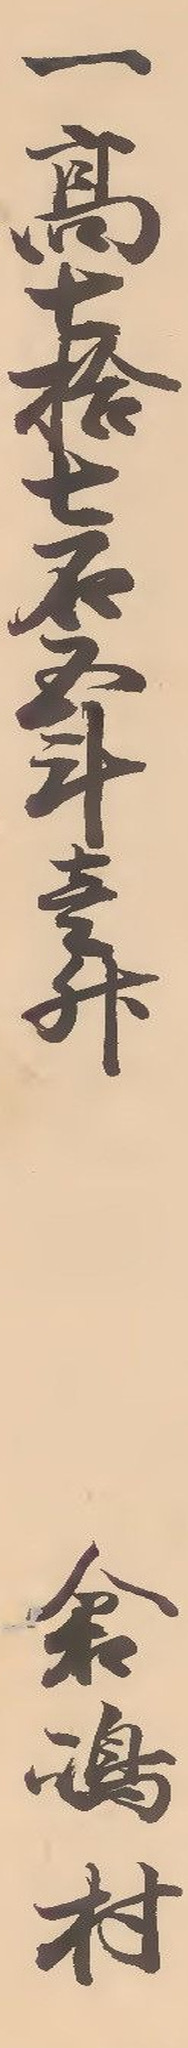一高七拾七石五斗壱升倉島村

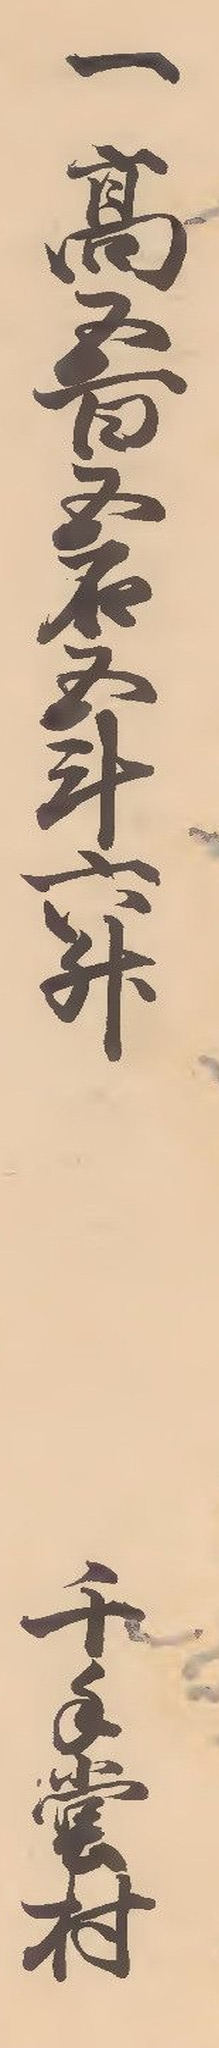一高五百五石五斗六升千手堂村
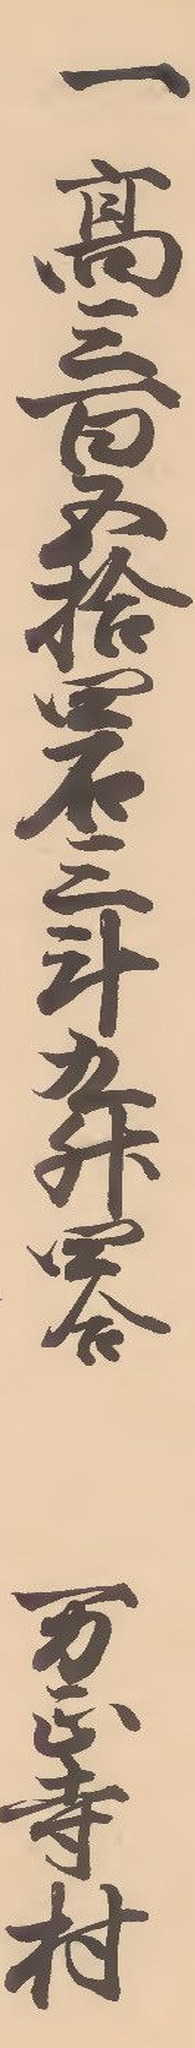一高三百五拾四石三斗九升四合万正寺村
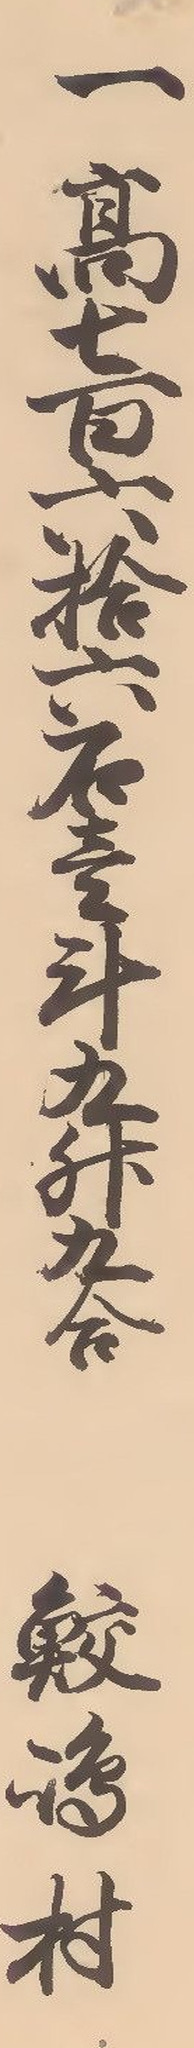一高七百六拾六石壱斗九升九合鮫島村
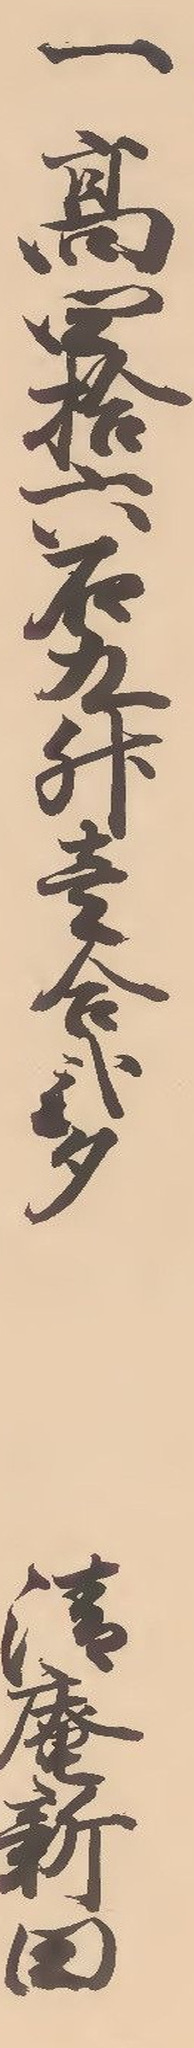一高四拾六石九升壱合弐勺清庵新田
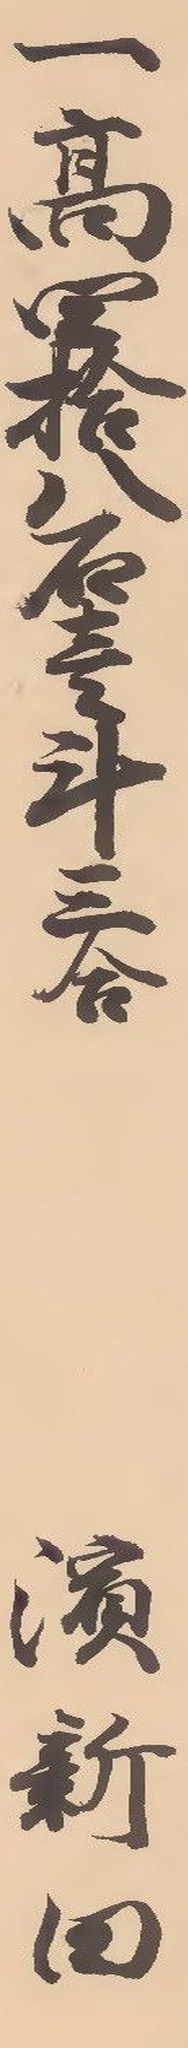一高四拾八石壱斗三合浜新田
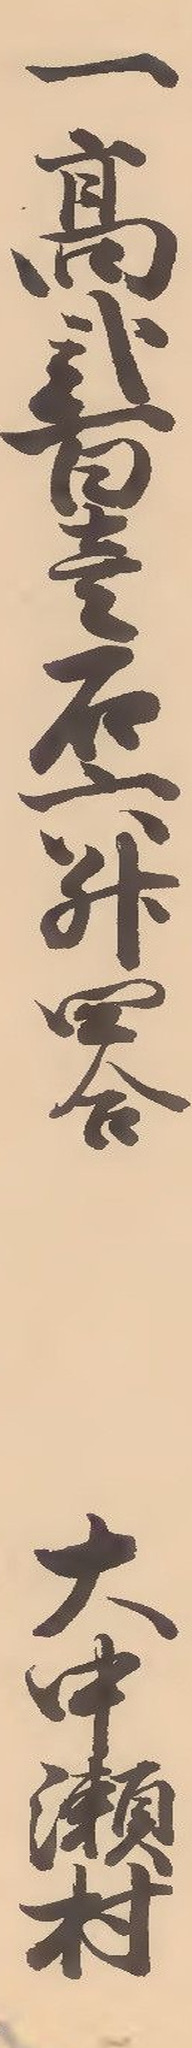一高弐百壱石六升四合大中瀬村
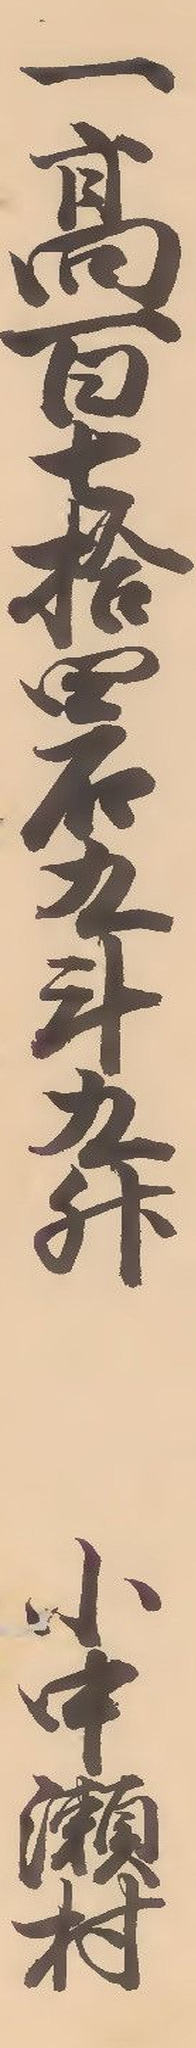一高百七拾四石九斗九升小中瀬村

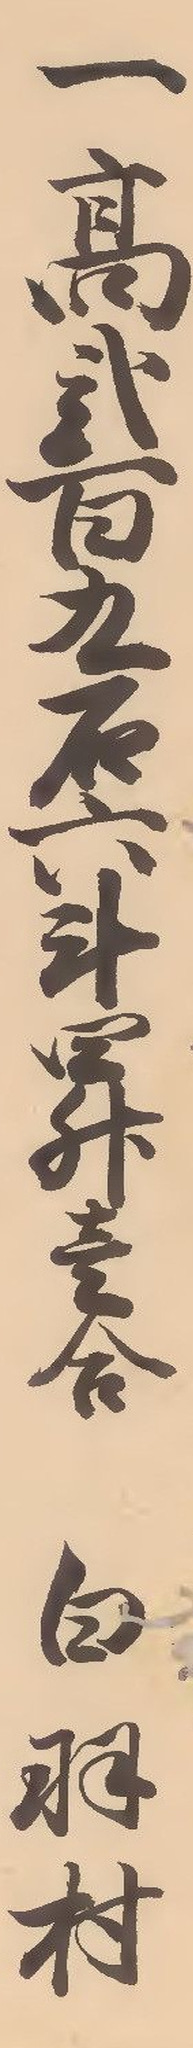一高弐百九石六斗四升壱合白羽村
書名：遠江国郷帳
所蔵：国立公文書館 National Archives of Japan
